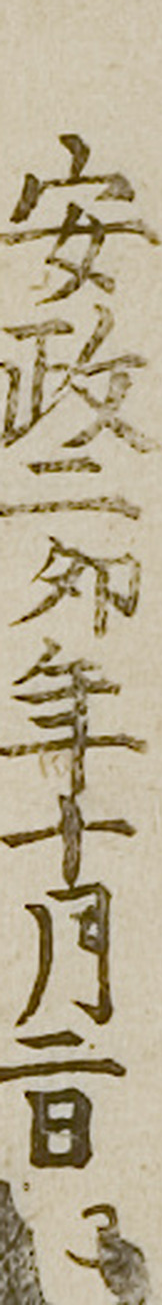安政二卯年十月二日
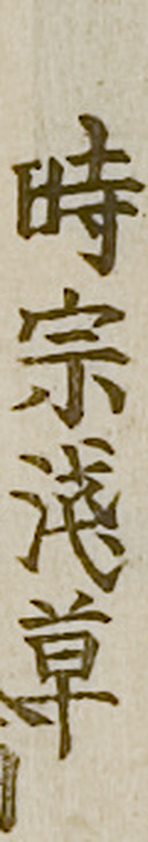時宗浅草
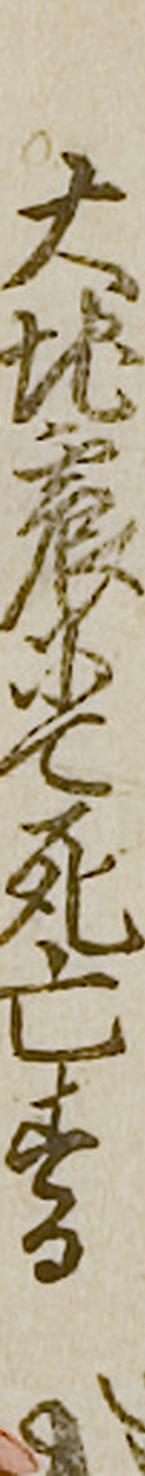大地震にて死亡する
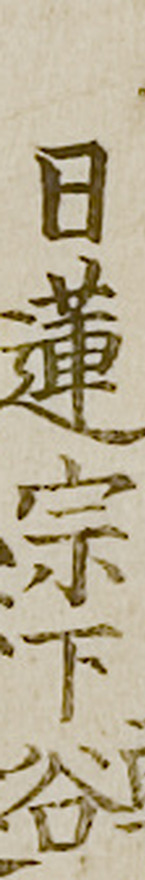日蓮宗下谷
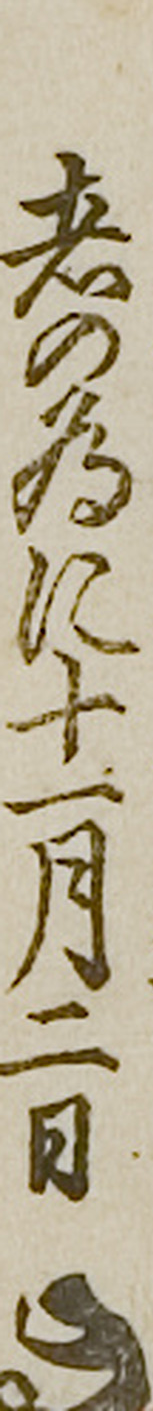者の為に十一月二日
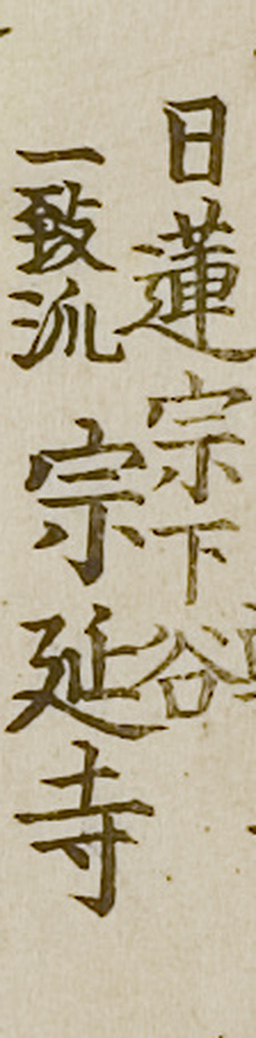一致派宗延寺
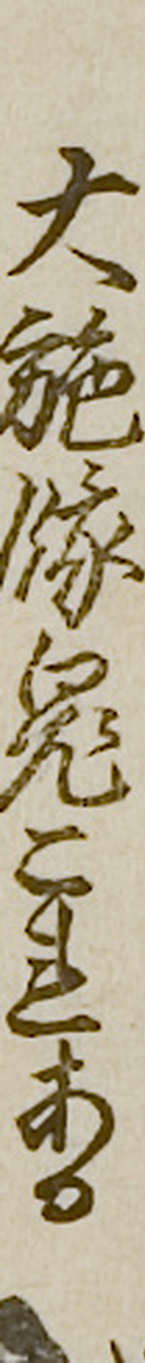大施餓鬼これある
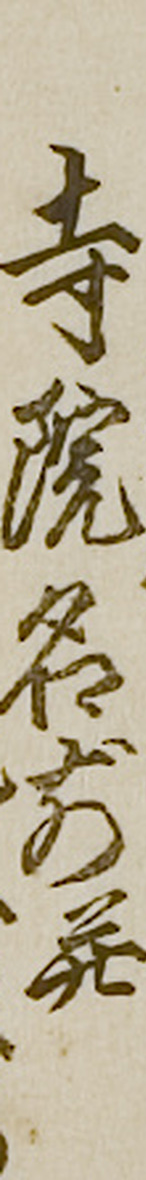寺院名前幷
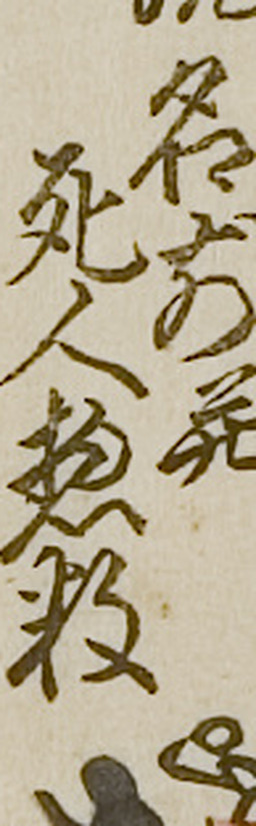死人惣数
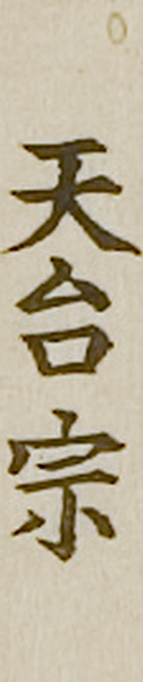天台宗
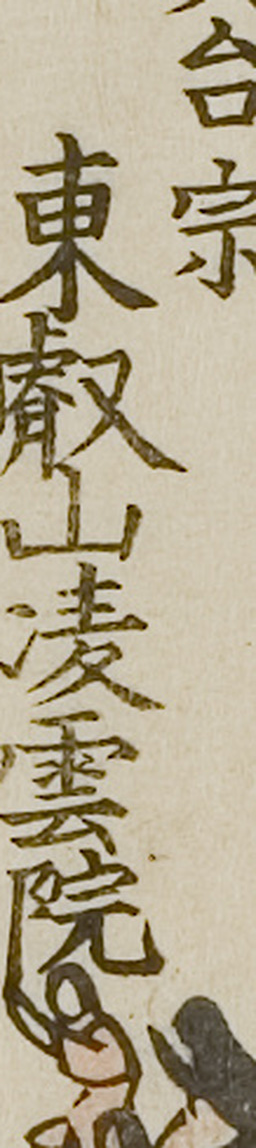東叡山凌雲院
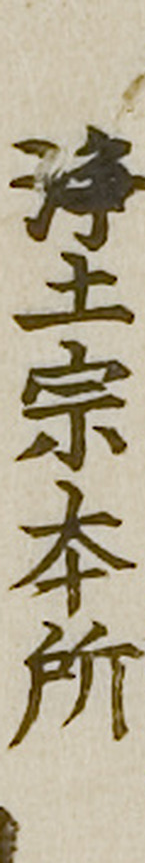浄土宗本所
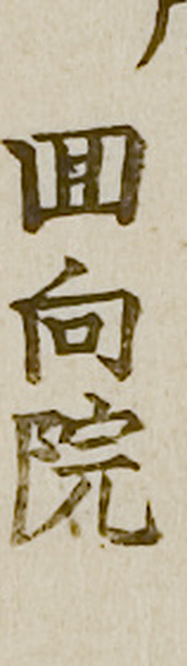回向院
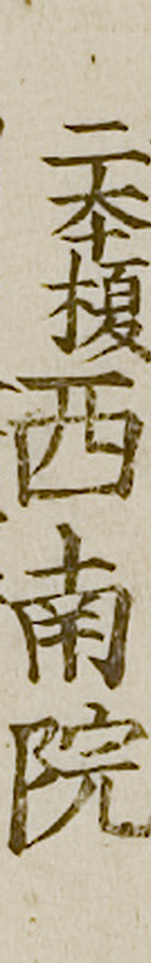二本榎西南院
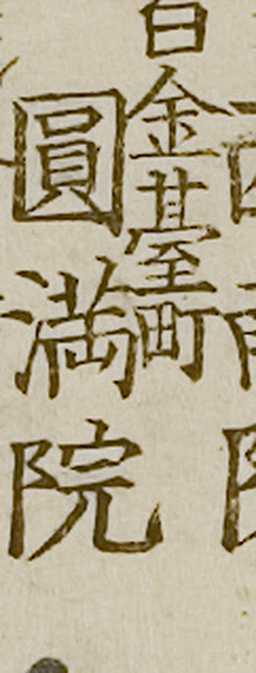圓満院
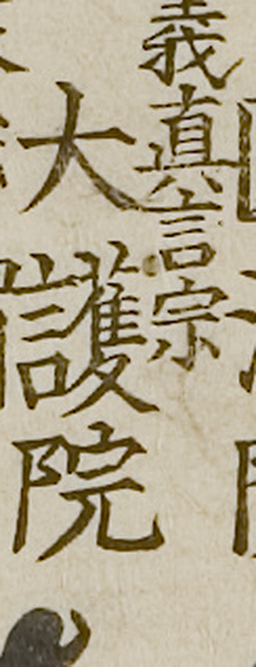大護院
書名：[地震死者施餓鬼図]
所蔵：東京大学総合図書館 General Library in the University of Tokyo, JAPAN
